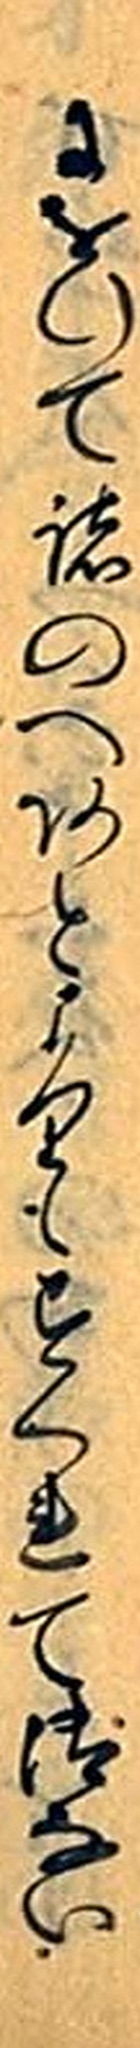にをひて諸のへあとよりもすくれて御ない
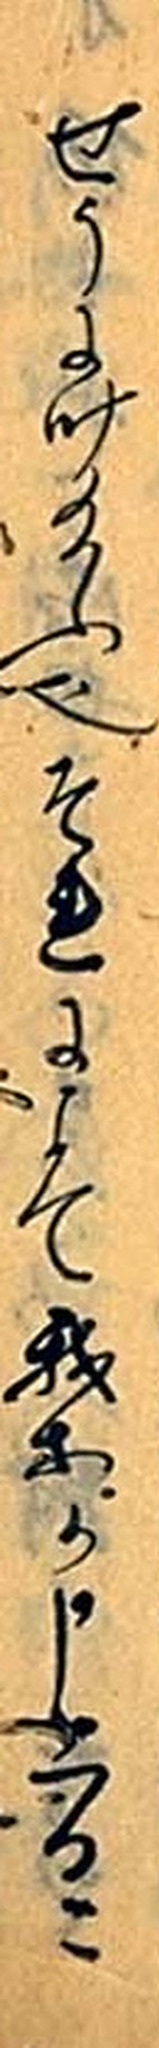せうに叶給ふ也それによて我等か申上るこ
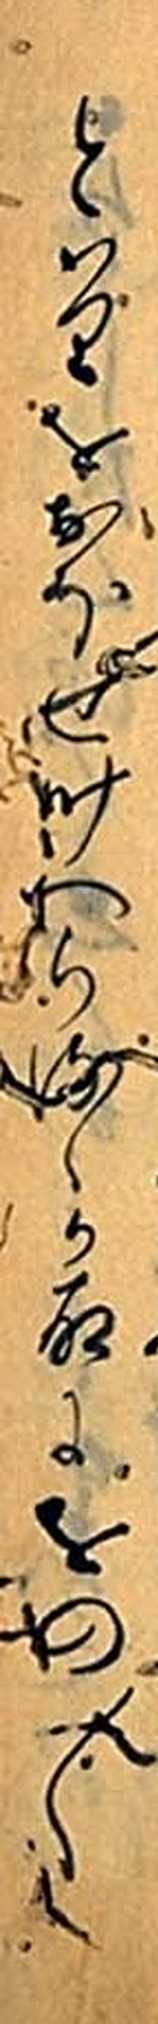とはりをおほせ叶へらるゝか故にをの〳〵

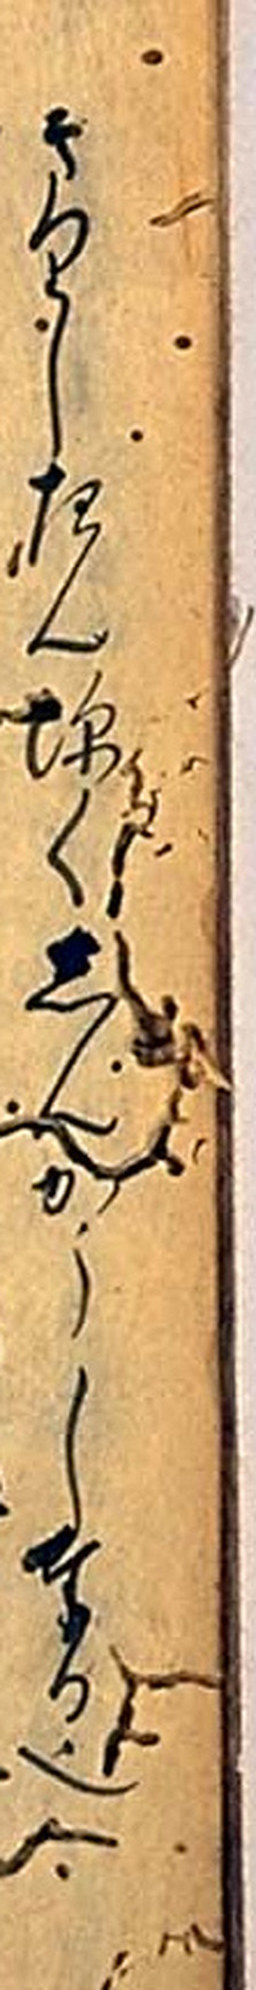きりしたん深くしんかうし奉る也
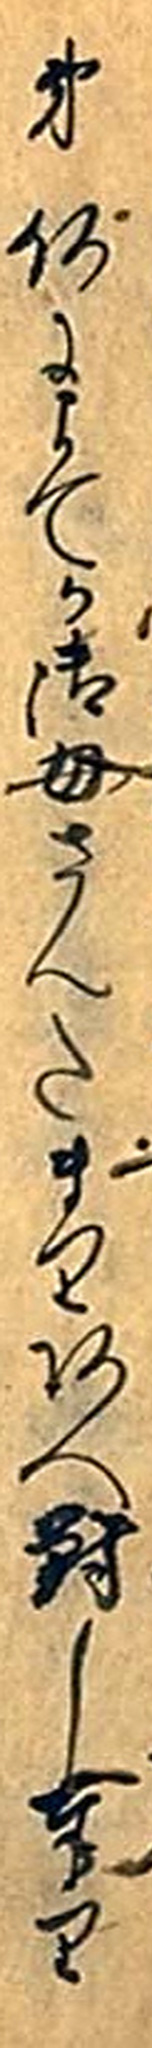弟何によてか御母さんたまりあへ対し奉り
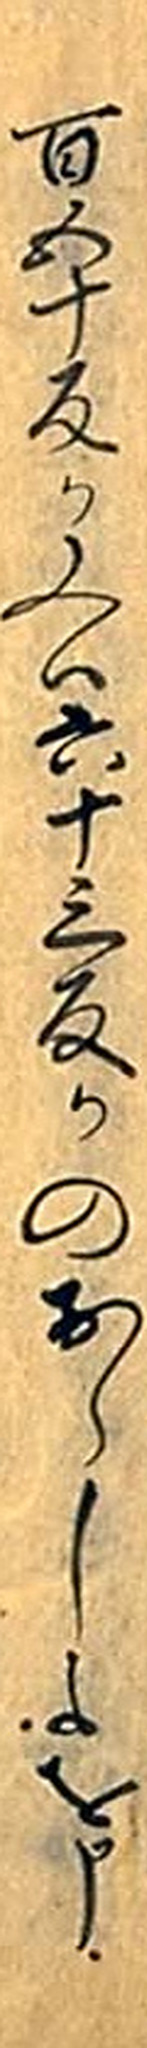百五十反か又は六十三反かのおらしよを申
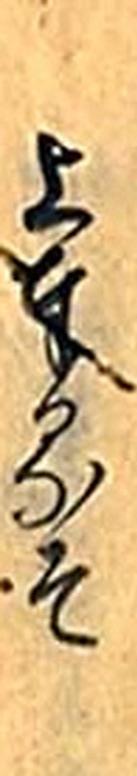上奉るそ
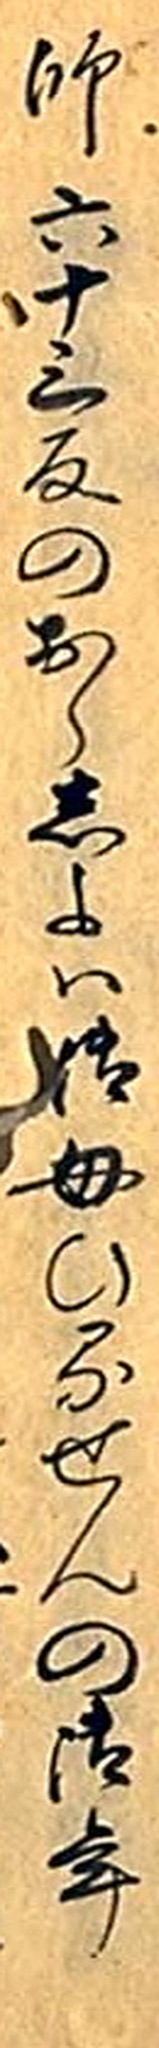師六十三反のおらしよは御母ひるせんの御年
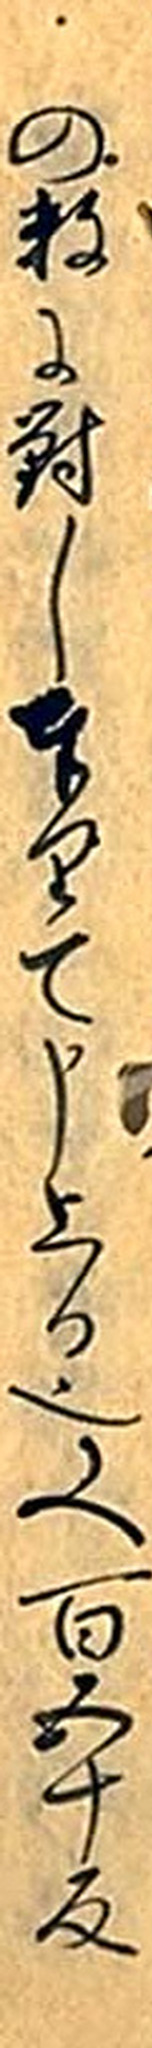の数に対し奉りて申上る也又百五十反
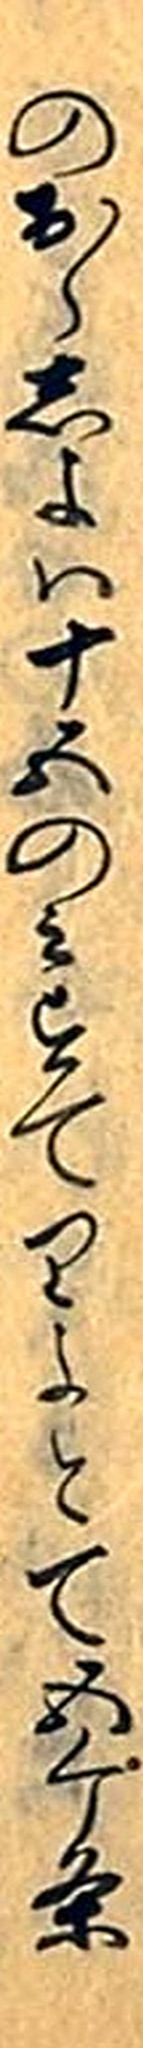のおらしよは十五のみすてりよとて五ケ条
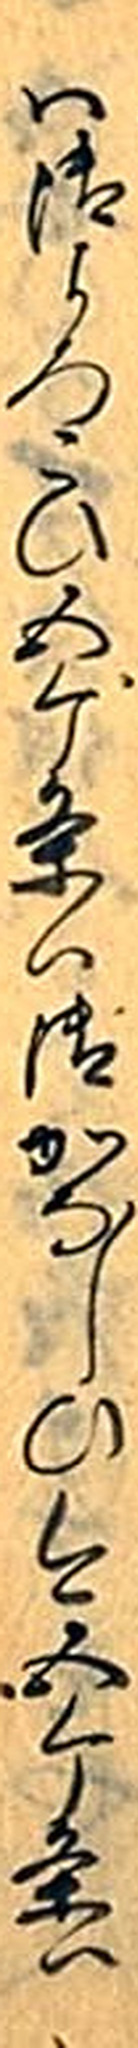は御よろこひ五ケ条は御かなしひ今五ケ条は
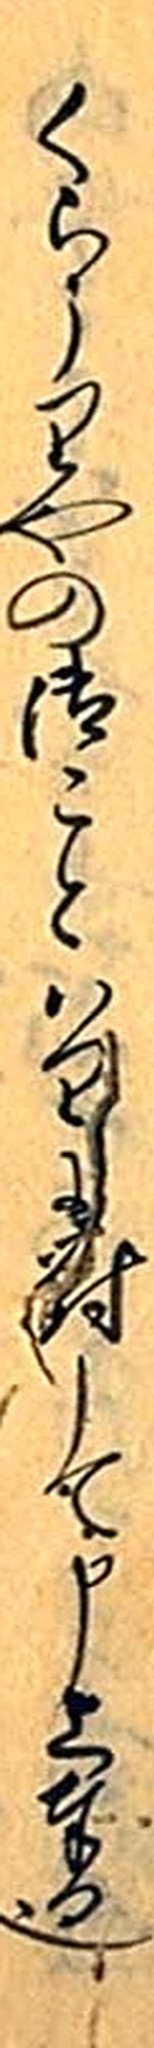くらうりやの御ことはりに対して申上奉る也
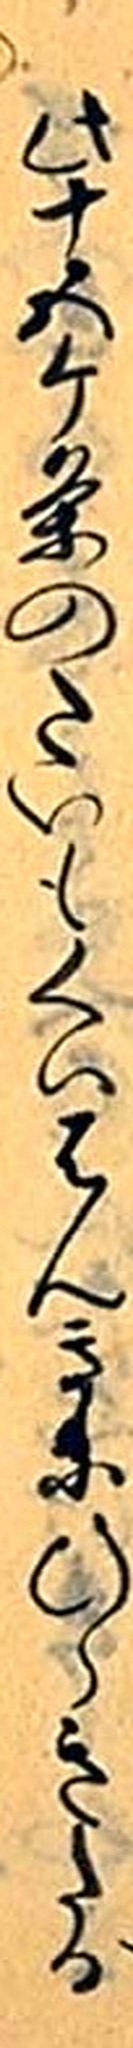此十五ケ条のたいもくははんきにひらきたる
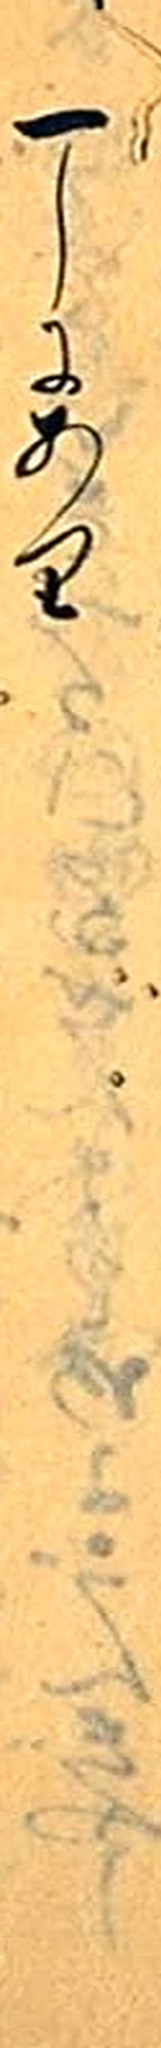一しにあり
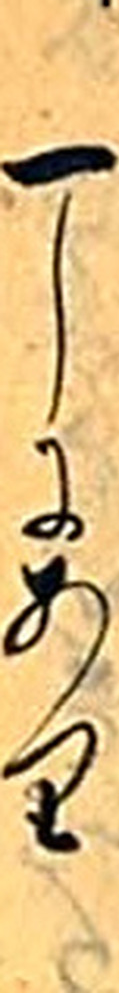一しにあり
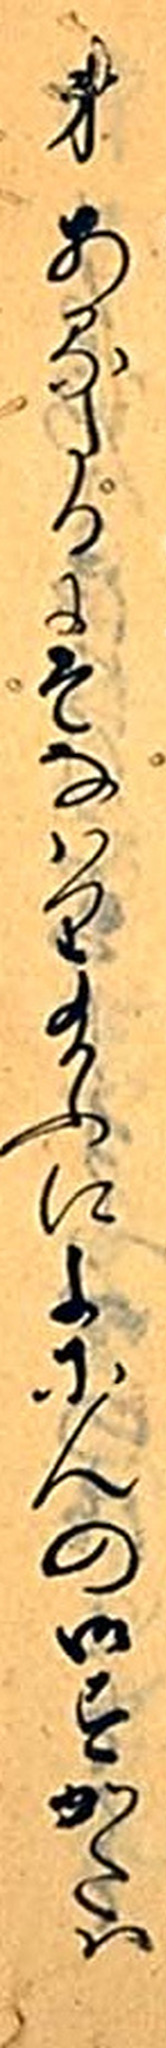弟あるたるにそなはり給ふによ人の御すかたは
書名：ドチリナ・キリシタン
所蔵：東京大学総合図書館 / General Library in the University of Tokyo
